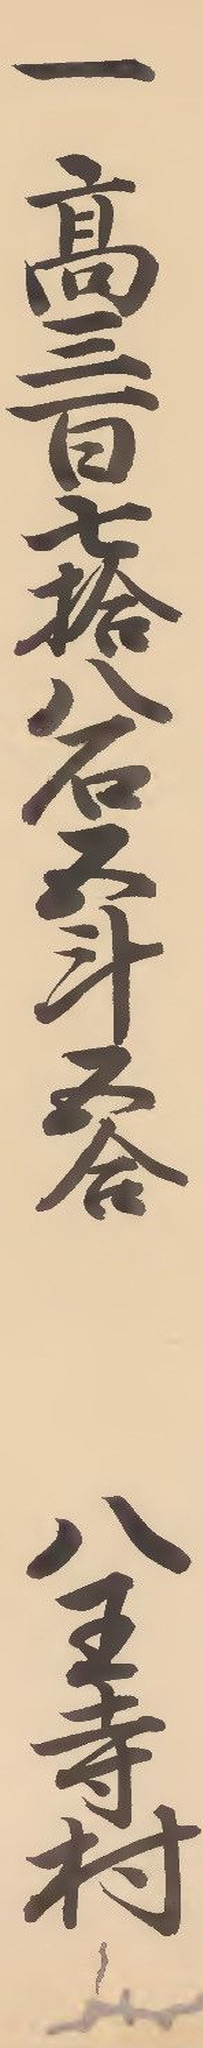一高三百七拾八石五斗五合八王寺村
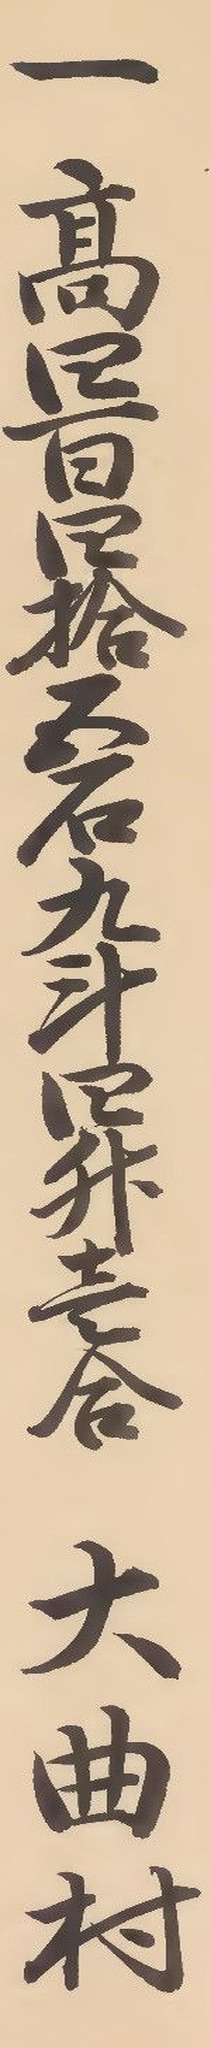一高四百四拾五石九斗四升壱合大曲村
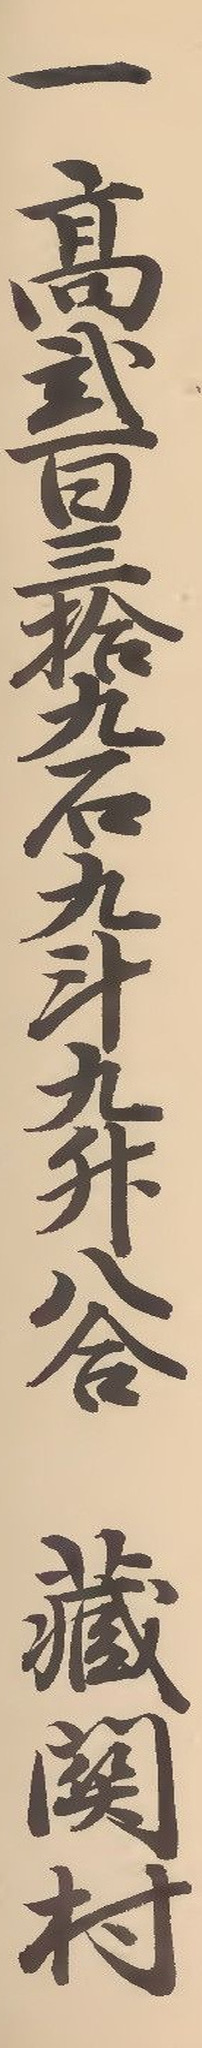一高弐百三拾九石九斗九升八合蔵関村
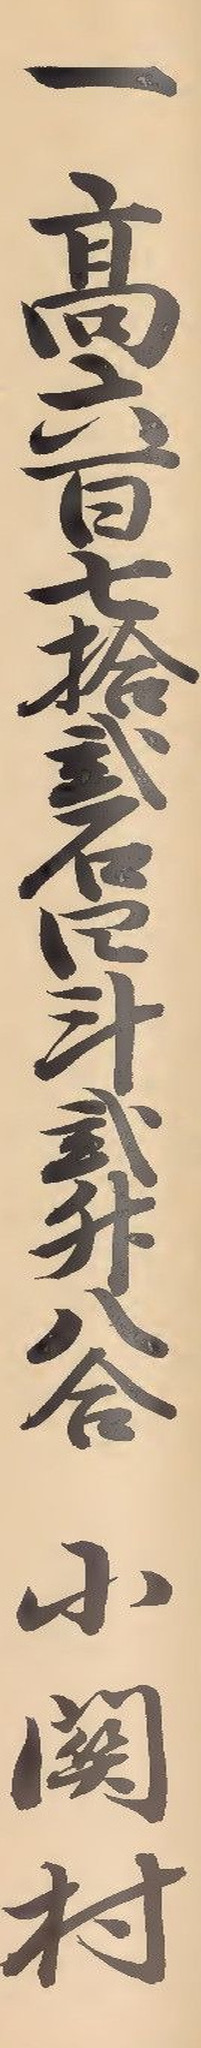一高六百七拾弐石四斗弐升八合小関村
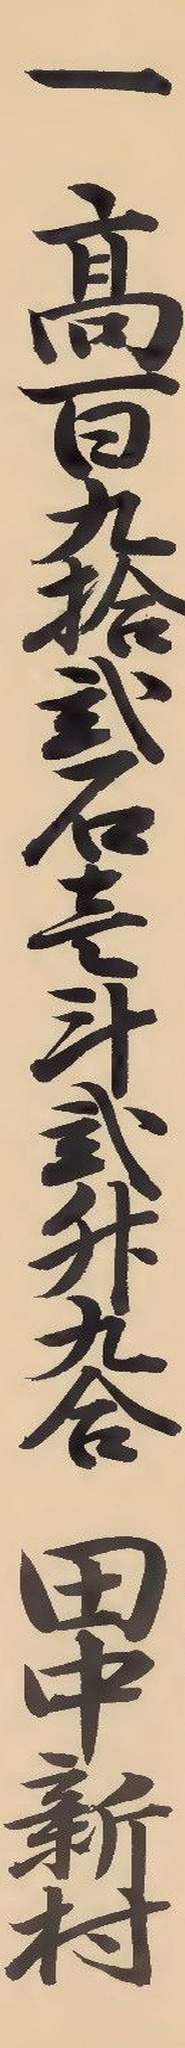一高百九拾弐石壱斗弐升九合田中新村
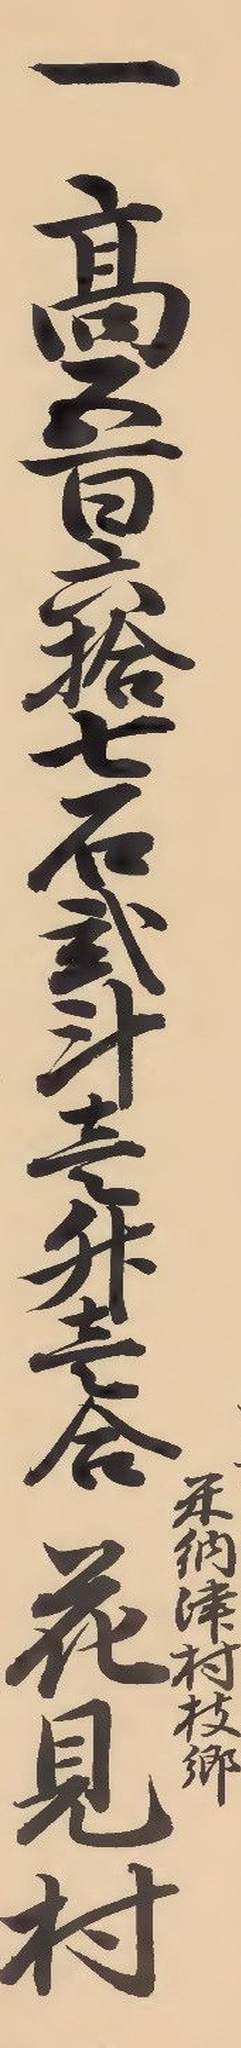一高五百六拾七石弐斗壱升壱合花見村
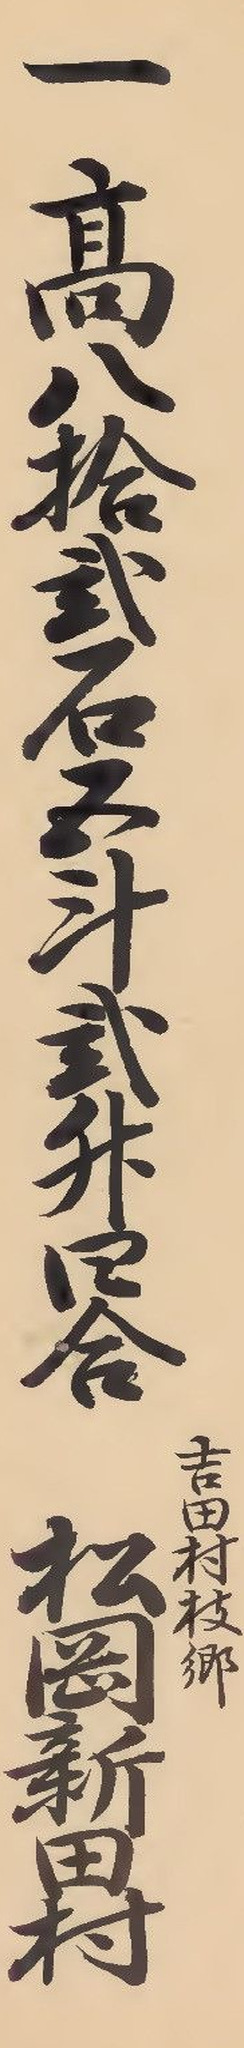一高八拾弐石五斗弐升四合松岡新田村

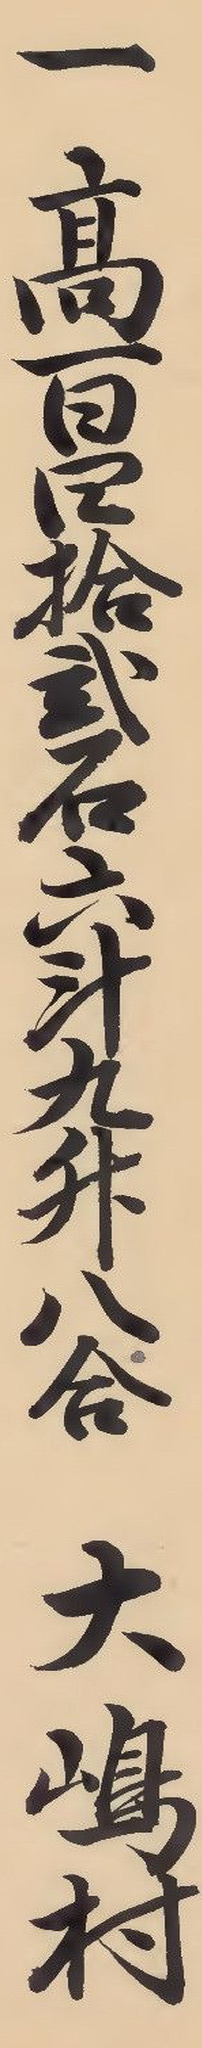一高百四拾弐石六斗九升八合大島村
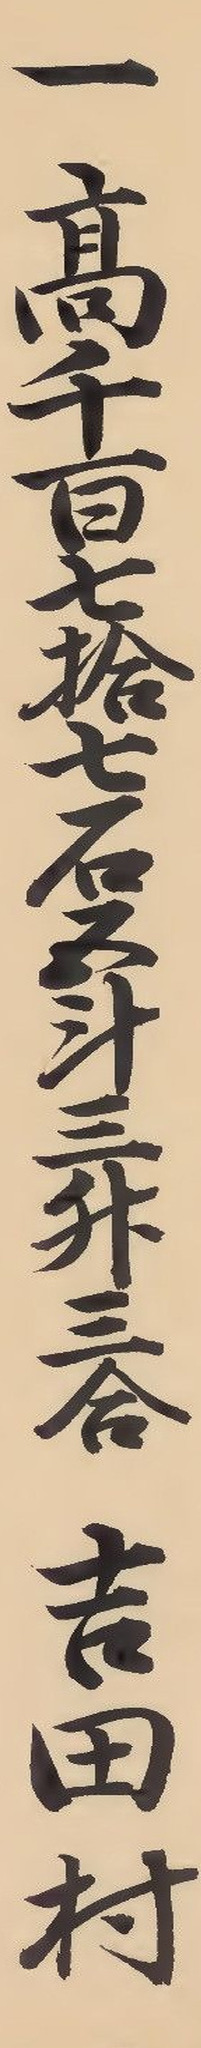一高千百七拾七石五斗三升三合吉田村
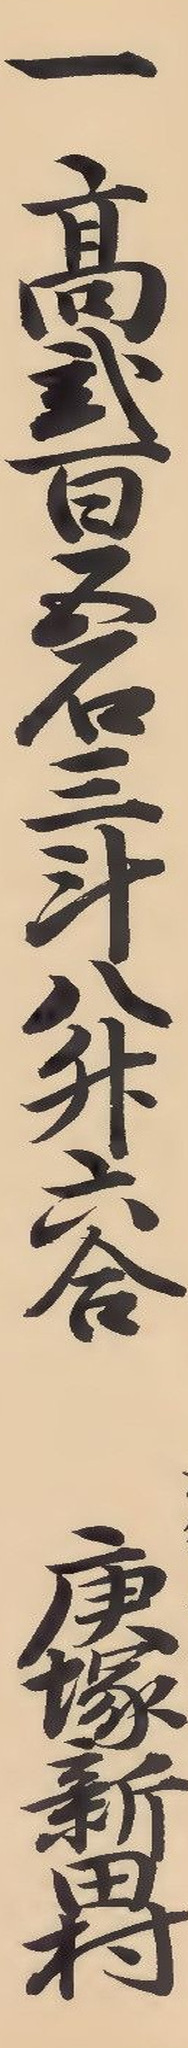一高弐百五石三斗八升六合庚塚新田村
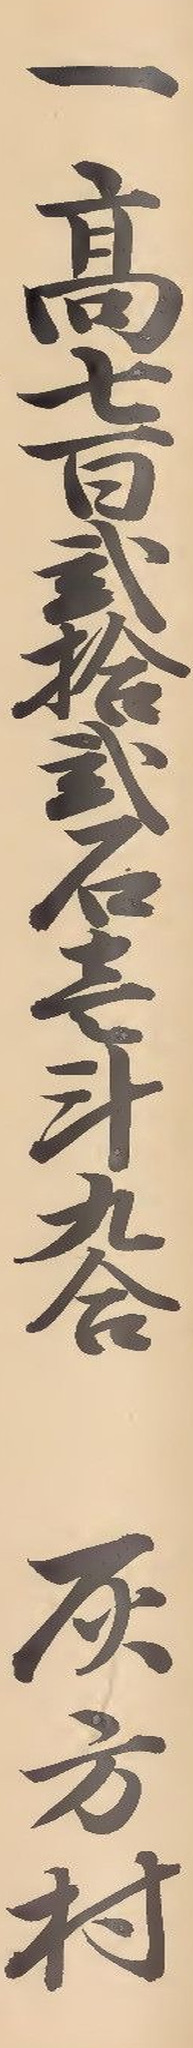一高七百弐拾弐石壱斗九合灰方村
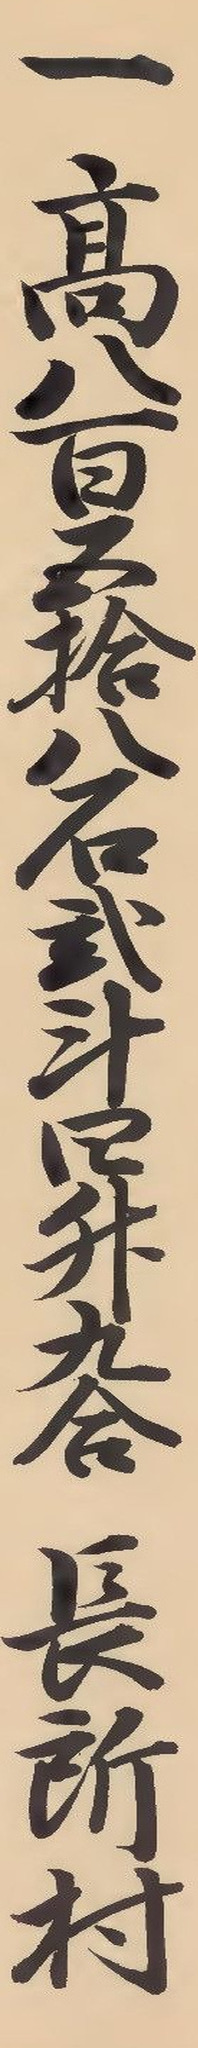一高八百五拾八石弐斗四升九合長所村
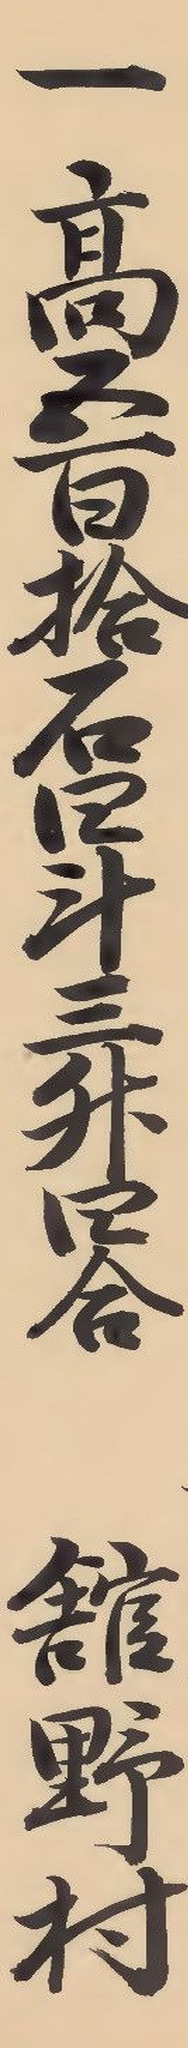一高五百拾石四斗三升四合舘野村
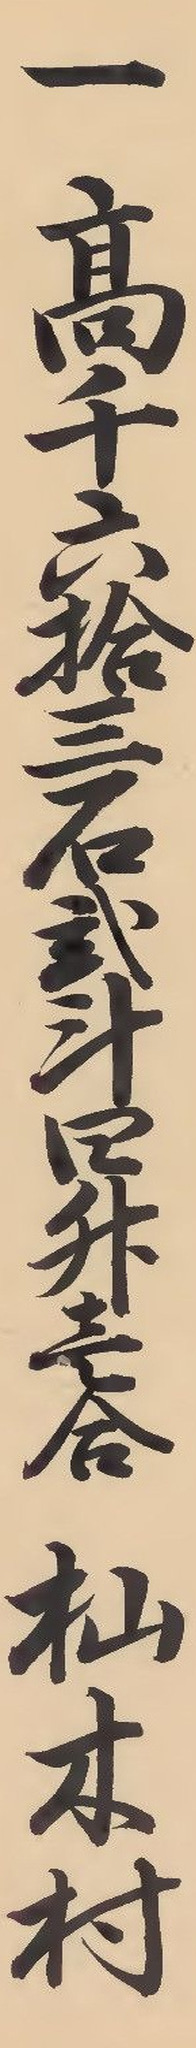一高千六拾三石弐斗四升壱合杣木村

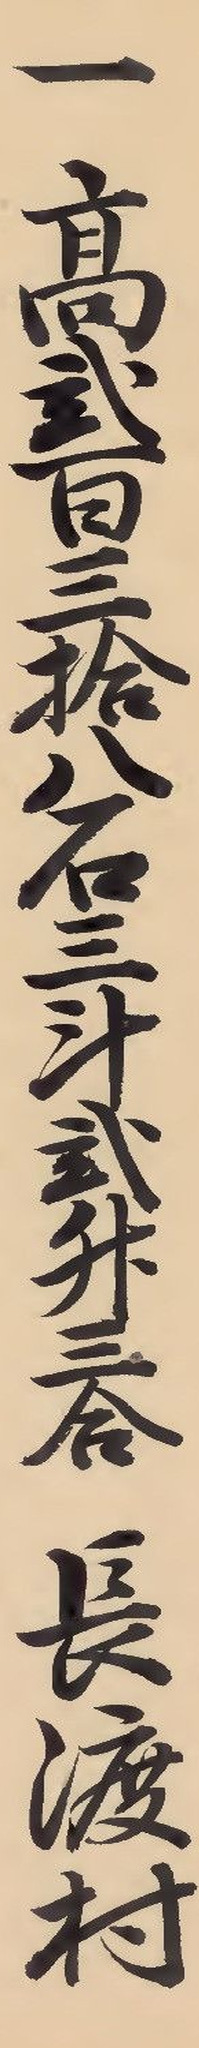一高弐百三拾八石三斗弐升三合長渡村
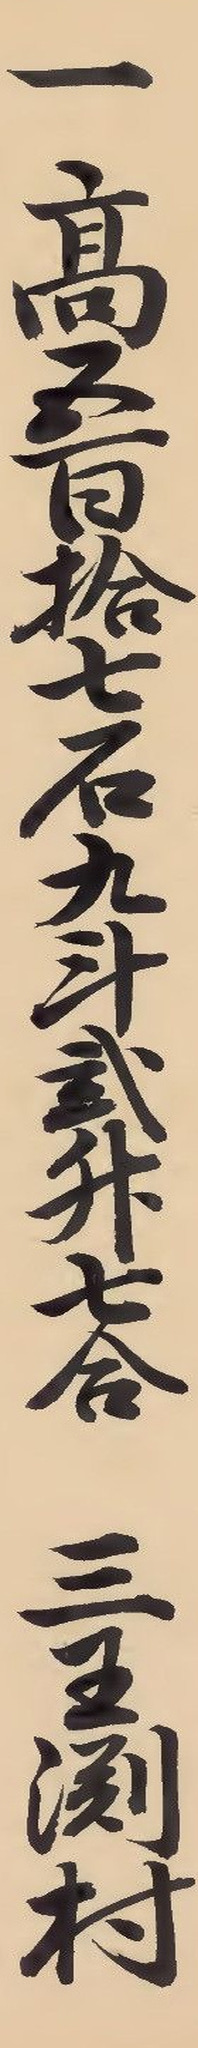一高五百拾七石九斗弐升七合三王淵村
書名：越後国郷帳　下
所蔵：国立公文書館 National Archives of Japan
